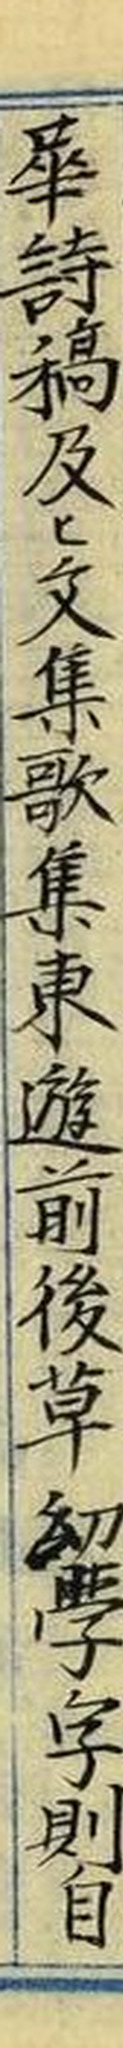蕐詩稿及ヒ文集歌集東遊前後草幼學字則自
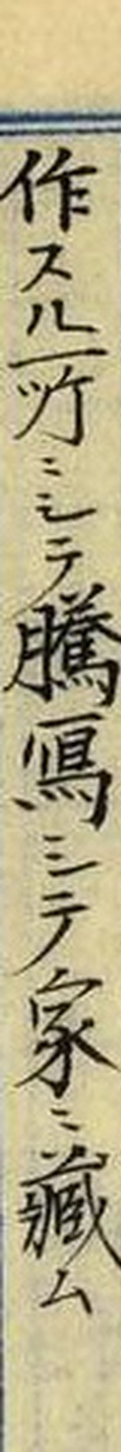作スル所ニシテ謄冩シテ家ニ藏ム
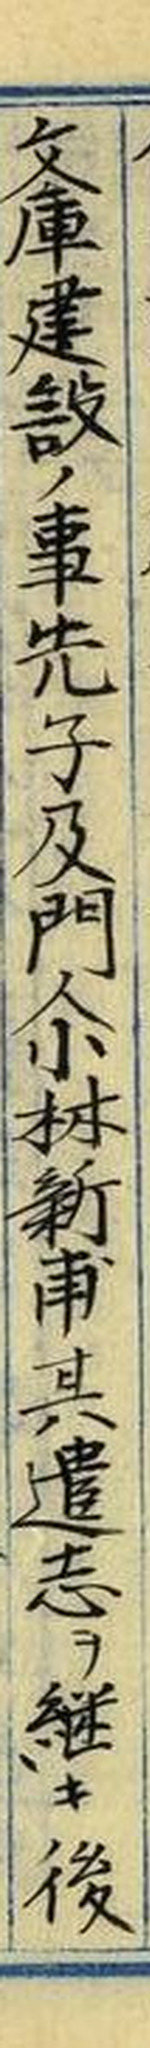文庫建設ノ事先子及門人小林新甫其遺志ヲ継キ後
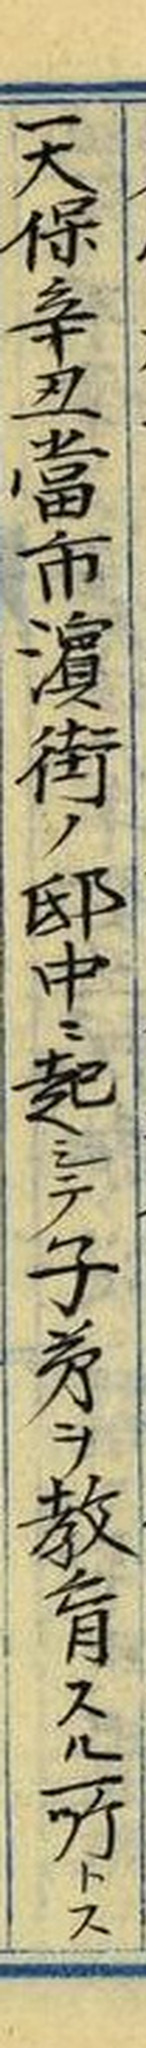天保辛丑當市濵街ノ邸中ニ起シテ子弟ヲ教育スル所トス

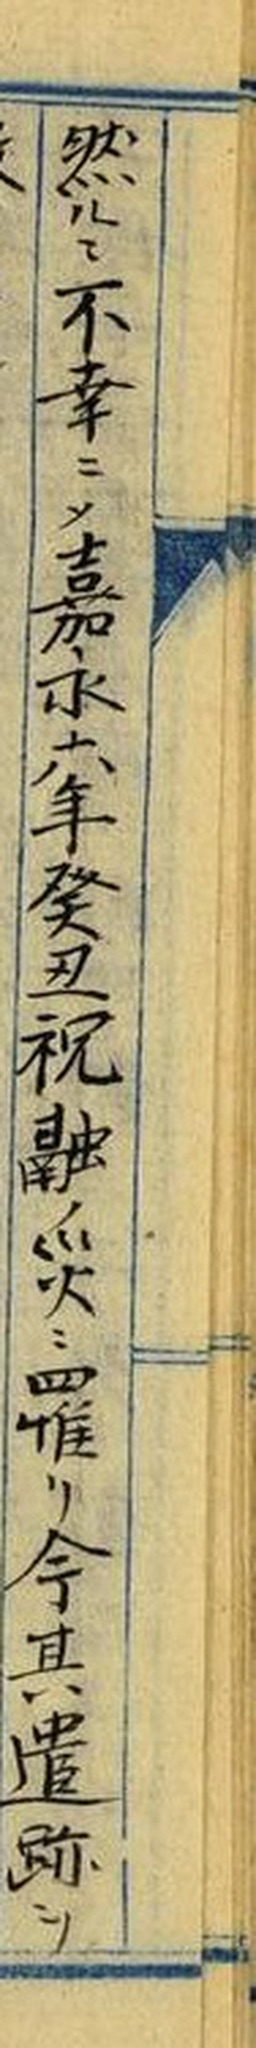然ルニ不幸ニシテ嘉永六年癸丑祝融ノ災ニ罹リ今其遺跡ヲ
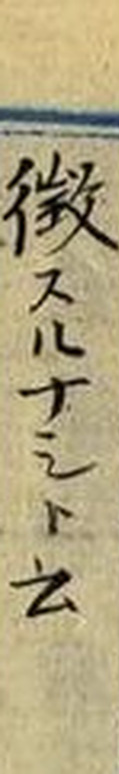徴スルナシト云
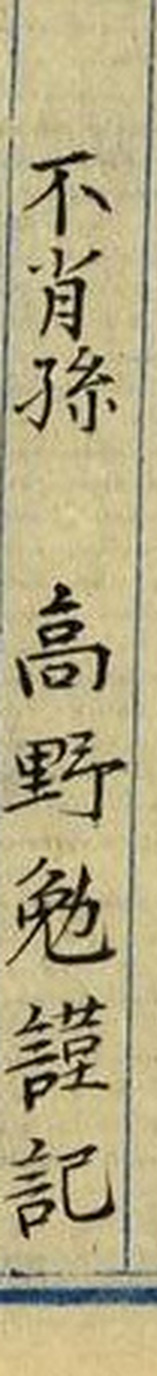不肖孫高野勉謹記
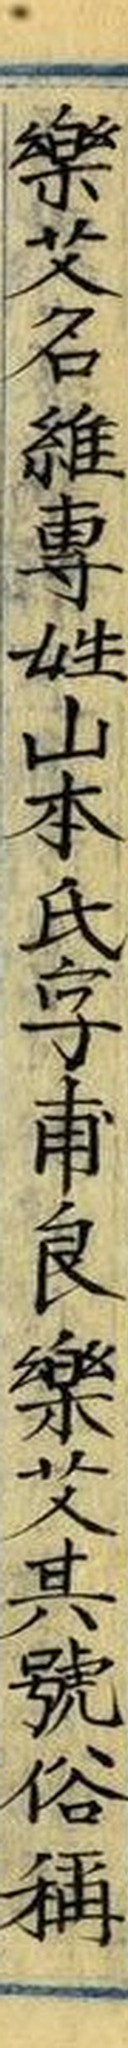樂艾名維專姓山本氏字甫良樂艾其號俗稱
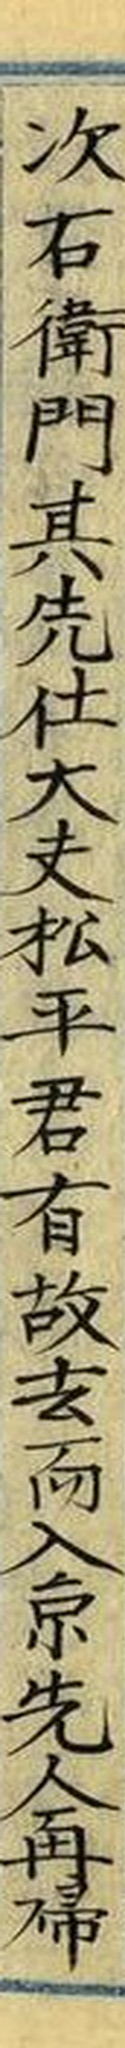次右衛門其先仕大夫松平君有故去而入京先人再帰
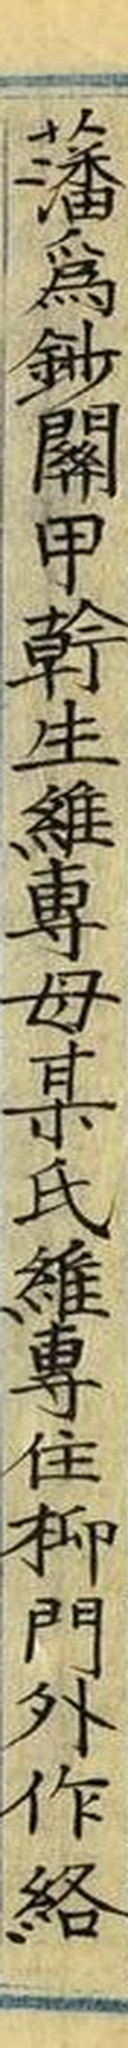藩爲鈔關甲幹生維專母某氏維專住柳門外作絡
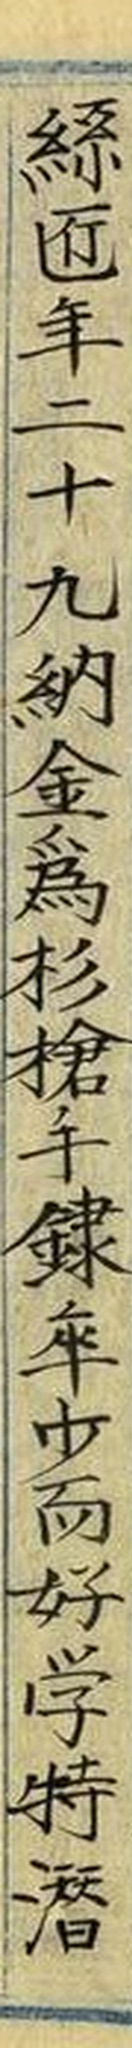匠年二十九納金爲杉槍手卒少而好学特潜
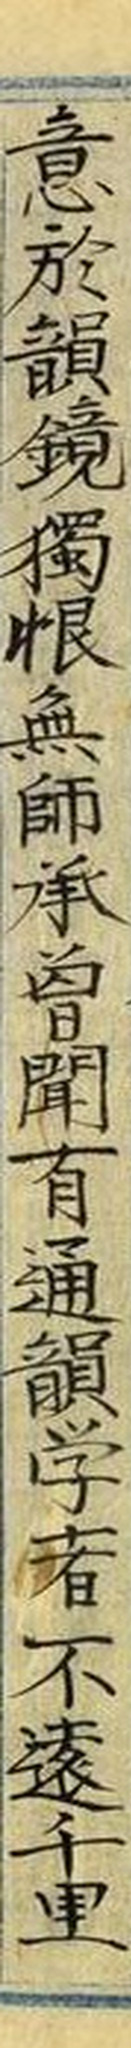意於韻鏡獨恨無師承曽聞有通韻学者不遠千里
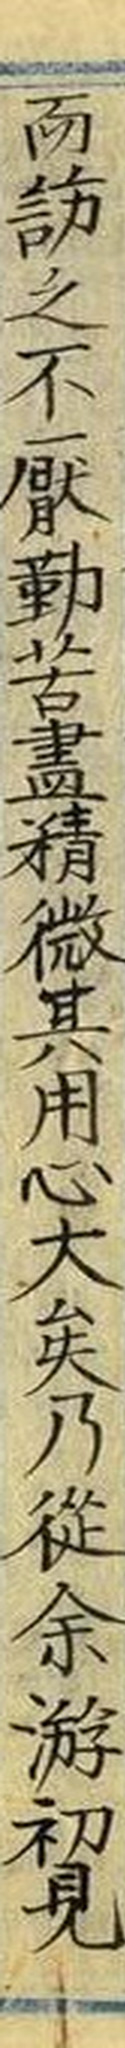而訪之不厭勤苦盡精徴其用心大矣乃從余游初見
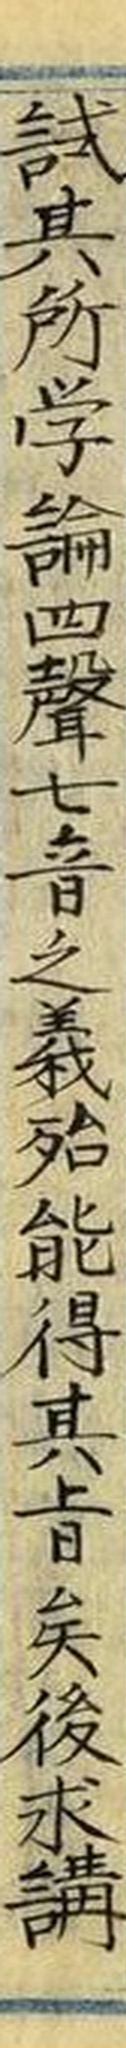試其所学論四聲七音之義殆能得其㫖矣後求講
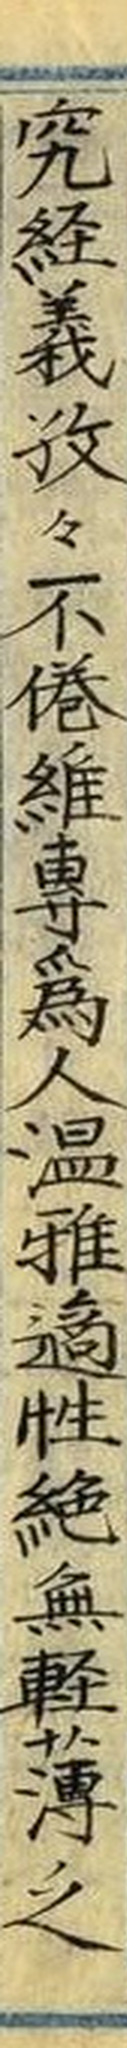究経義孜々不倦維專爲人温雅適性絶無軽薄之
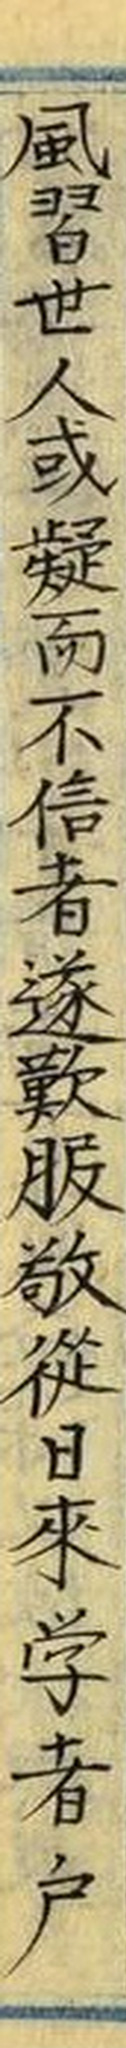風習世人或疑而不信者遂歎服敬從日來学者戸
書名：温古集 四巻
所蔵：福井県文書館 Fukui Prefectural Archives
